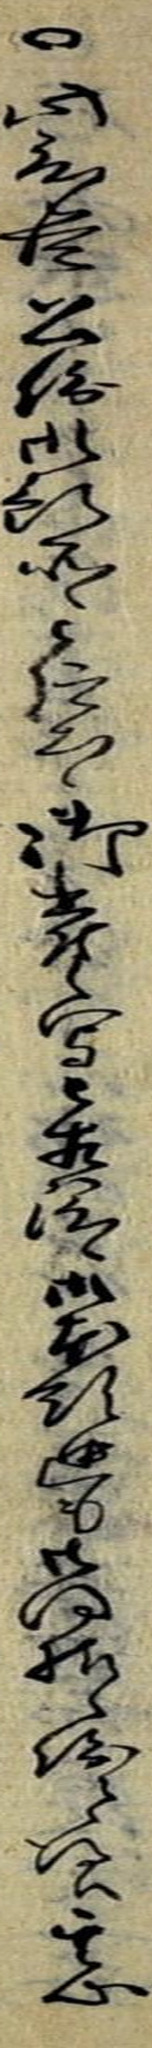○此度従公儀御預所へ被仰出候御書付之写被相渡候御本領迚も御同様之儀ニ候得ハ其心
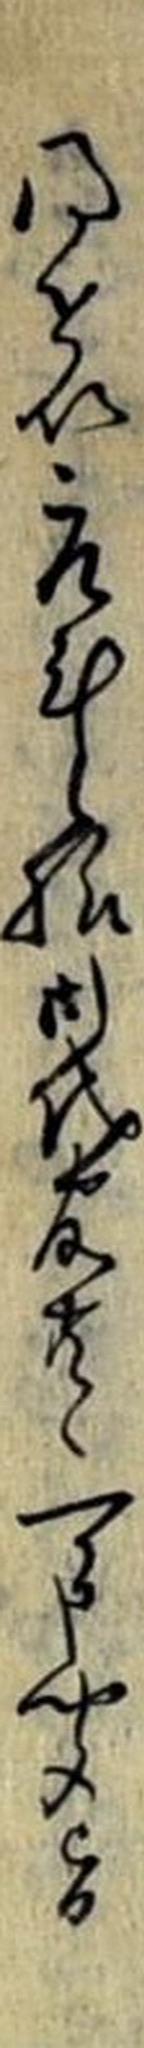得を以取計候様御代官共へ可申聞旨
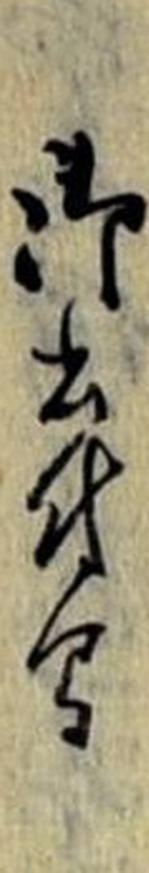御書付写
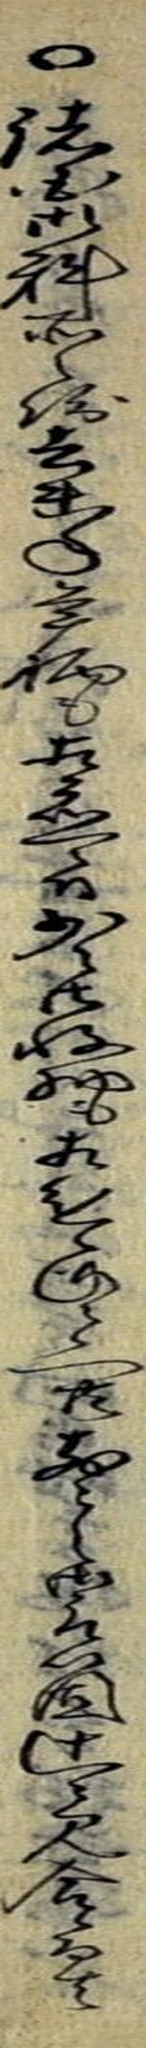○諸国御料所之儀去未年年柄も相応ニ付少々御収納も相進候趣ニ候へ共前々之御取箇辻々見合候而は
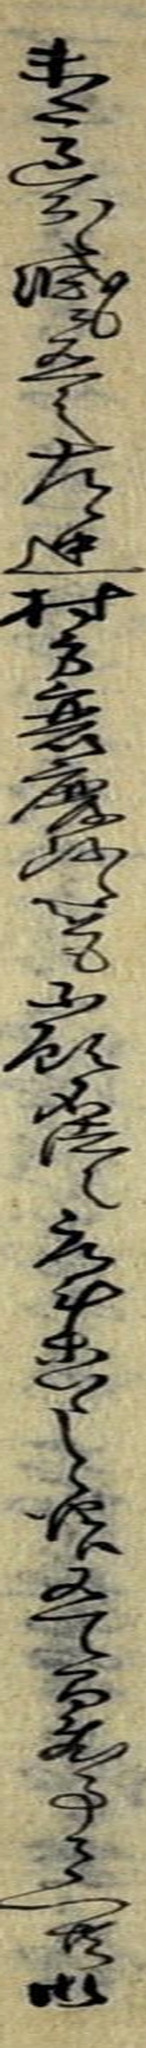未た過分之減も有之左候迚村方衰廃致候をも不顧不法之取計等いたし候儀ハ有之間敷事ニ候へ共御
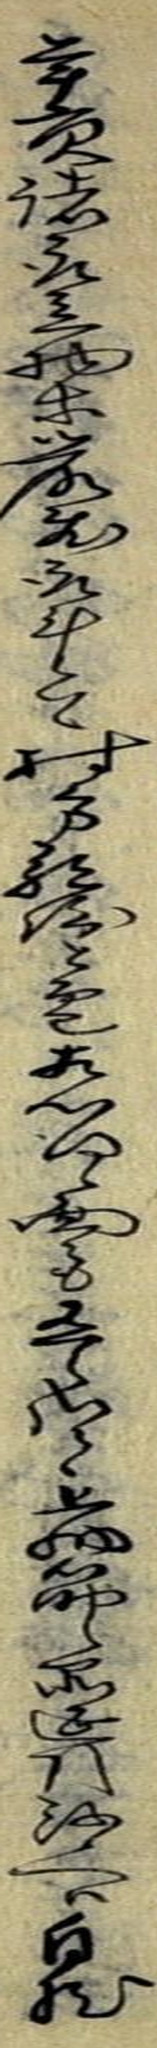年貢諸取立物等厳敷取計候ハヽ村方難儀と而已相心得候面々も有之哉ニ候上納筋之品延引致候へハ自然
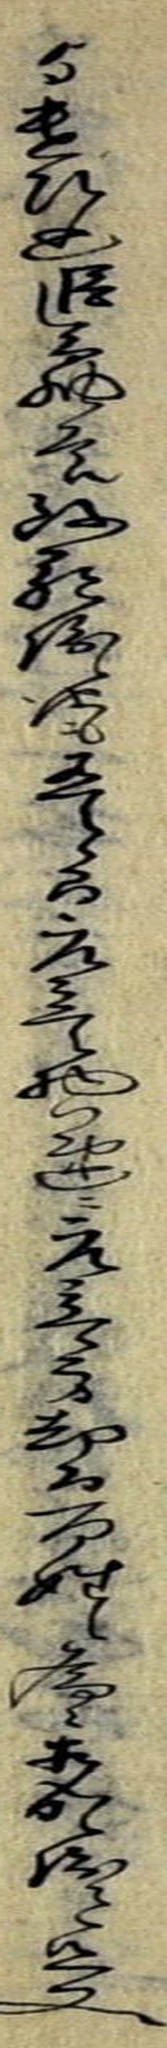と遣ひ込追而納候節致難儀候儀も有之候間取立之物ハ速ニ取立候方却而百姓之為ニ相成儀ニ候且又
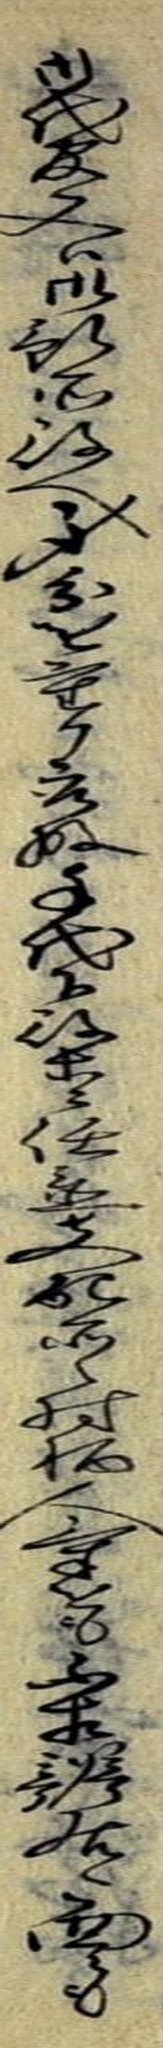御代官又ハ御預所役人身分を重ク取扱手代下役等ニ任置支配所之村柄人気をも不相弁居候面々も
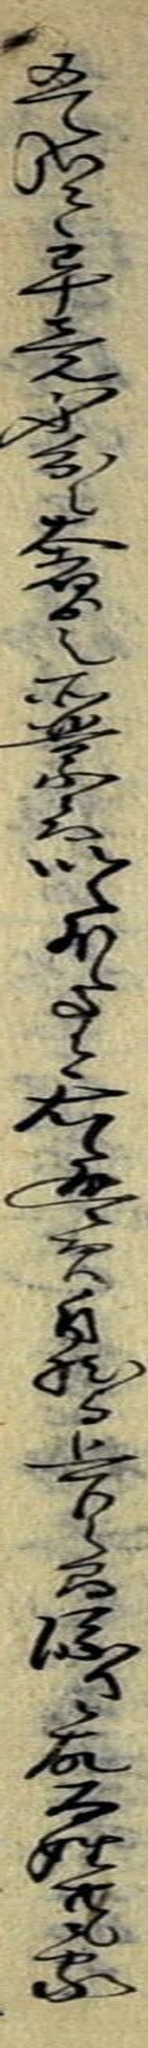有之哉ニ候畢竟身分之奢より之所業ニ而以之外之事ニ候右之通ニ而ハ自然と上下之間隔り候故百姓共も家
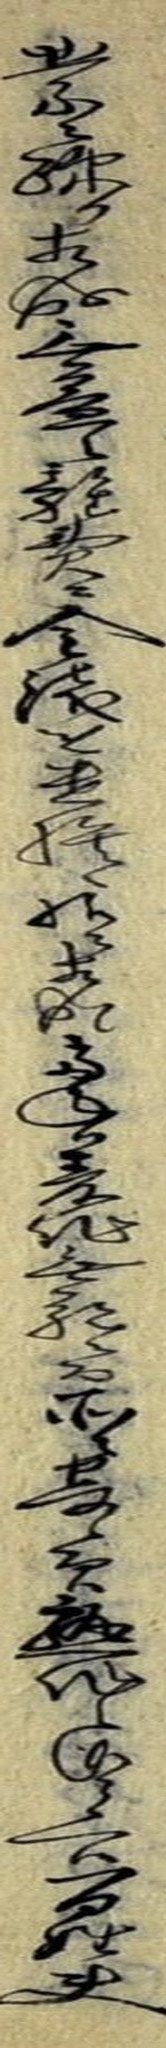業ニ疎ク相成無益之雑費ニ金銭を遣捨候様ニ相成候当年ハ麦作無難ニ而所ニ寄候而ハ熟作之趣ニ候へハ百姓夫
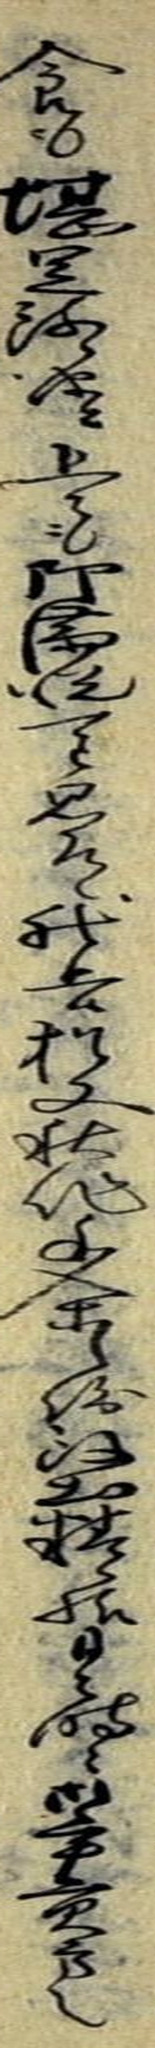食も堪足致候儀ニ上ニも御満悦可被思召候然上ハ猶又秋作手入等之儀致出精候様日々時々御年貢方之
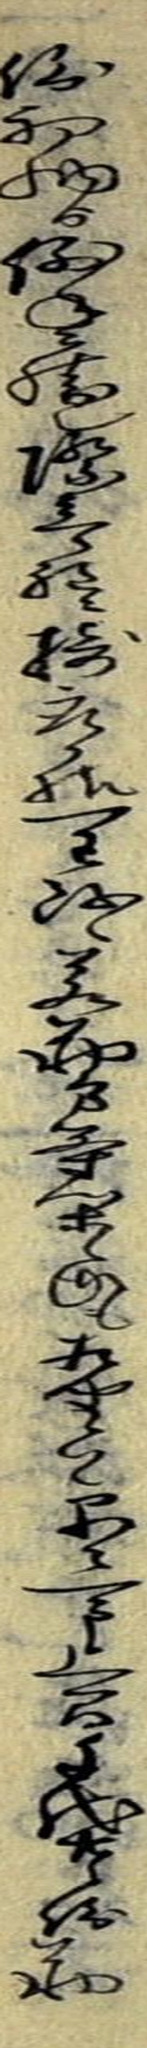儀初納より例年ニ勝レ際立候程ニ摂取候様可被致候若勤方等閑之趣も相聞候ハヽ早々可申上間手代共之儀勤
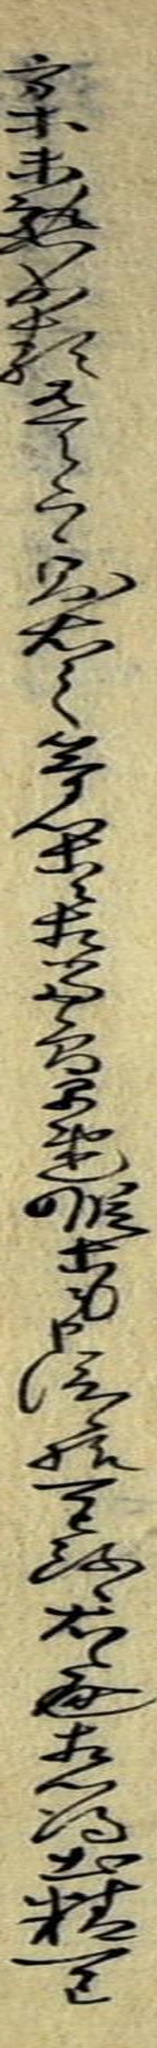方等未熟成類有之候ハヽ則右之等閑ニ相当候間早速暇等も申渡候様可被致候右之通相心得出精可被
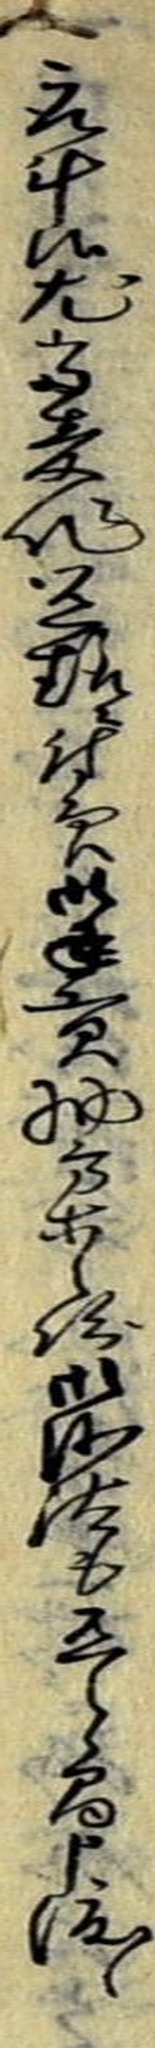取計候尤当麦作宜趣ニ付而ハ御年貢納方等之儀御沙汰も有之間申渡候

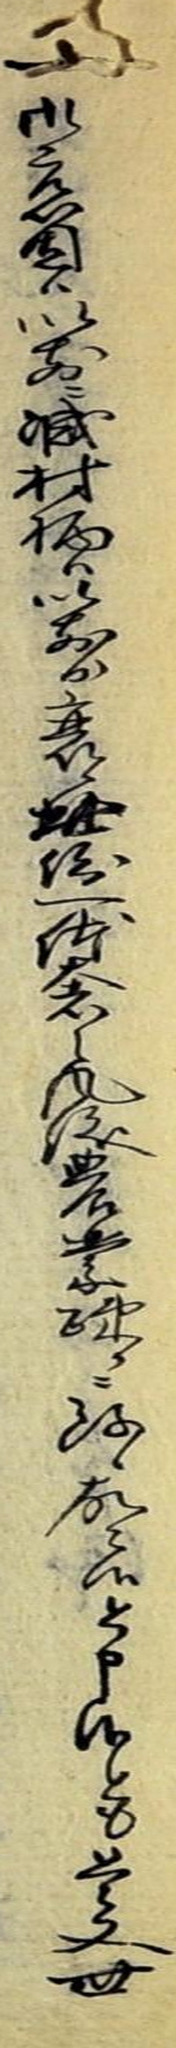一御取箇ハ以前ニ減村柄ハ以前ゟ衰候此儀一体奢之風儀農業疎かニ致候故ニ候と申候とも是又世
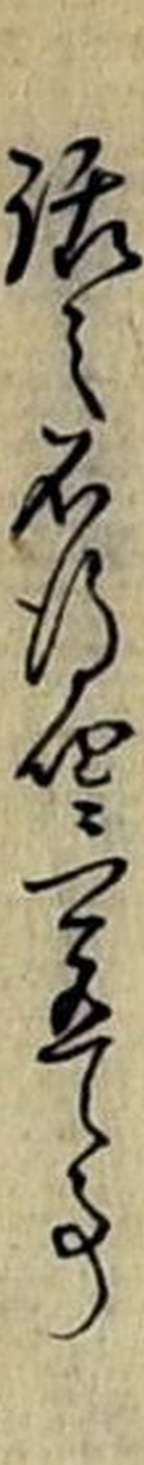話之不行届ニ可有之事
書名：命令之部 三
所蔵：福井県文書館 Fukui Prefectural Archives
